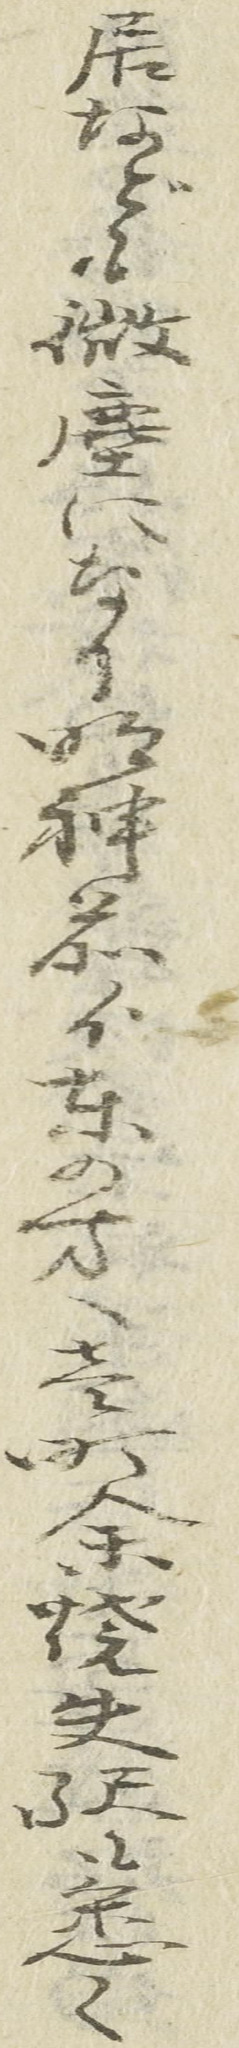居なども微塵になり明神前ゟ東の方へ壱町余焼失駅も悉く
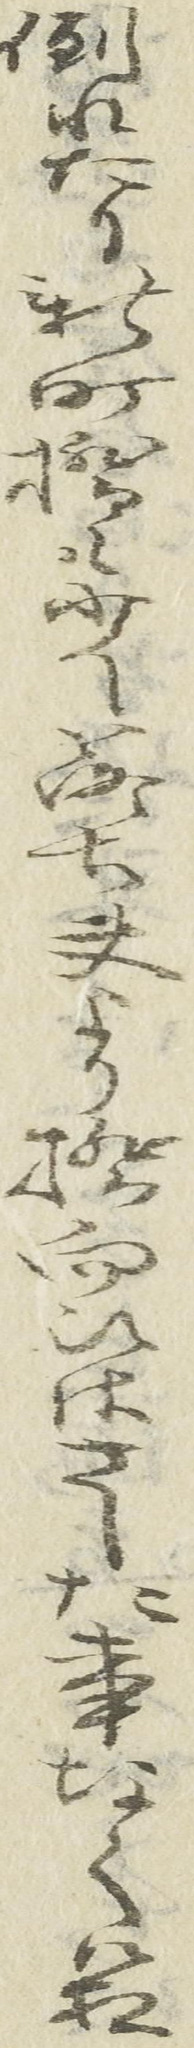倒れたり新町橋も少し落ち夫より橋向ひはさした事なく箱
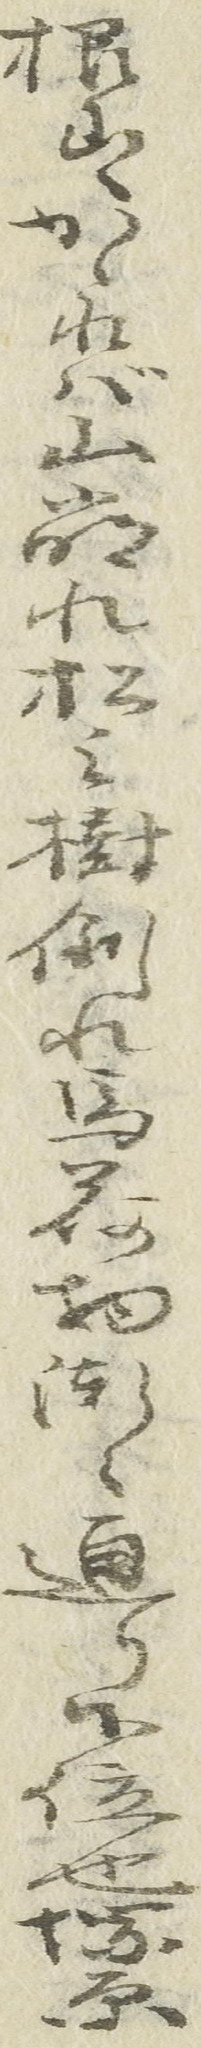根山へかゝれバ山崩れ松之樹倒れ馬荷物漸〻通り候位也塚原
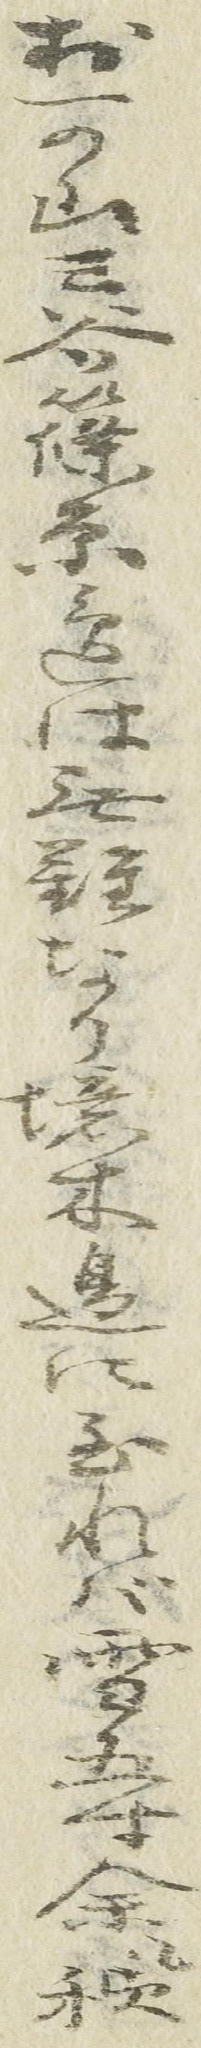村一の山三谷篠原邊は無難なり境木邊に至れバ雪五寸余も積
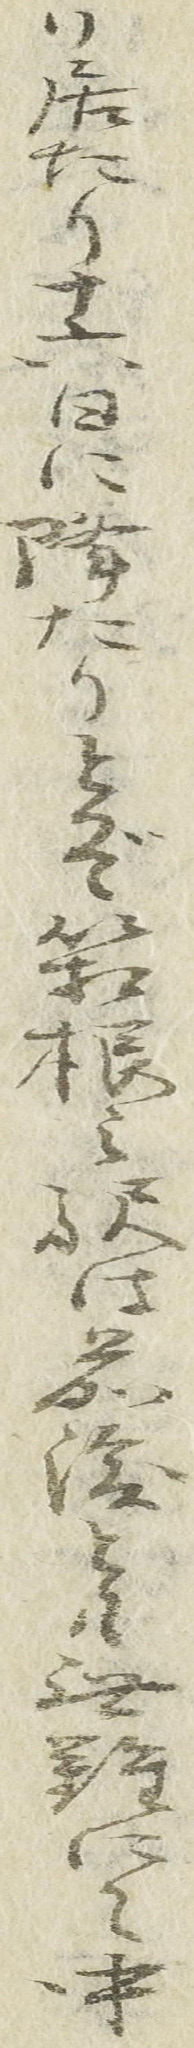り居たり十六日に降たりとぞ箱根之駅は前後とも無難にて中
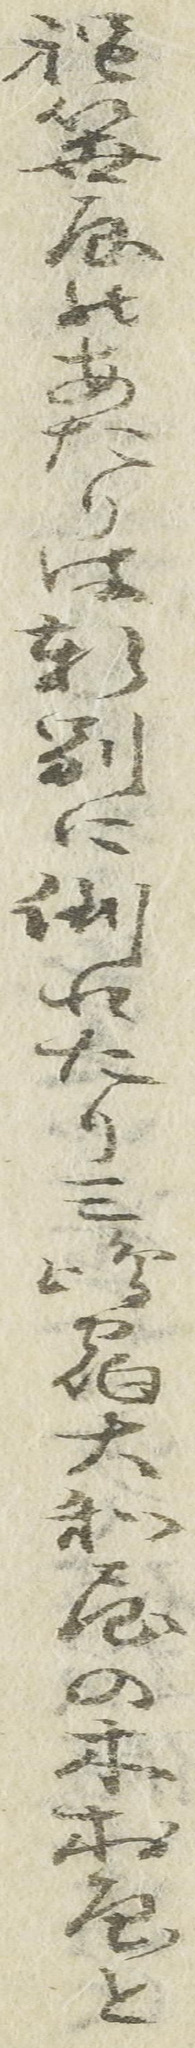程笹屋のあたりは軒別に倒れたり三嶋宿大和屋の木村屋と
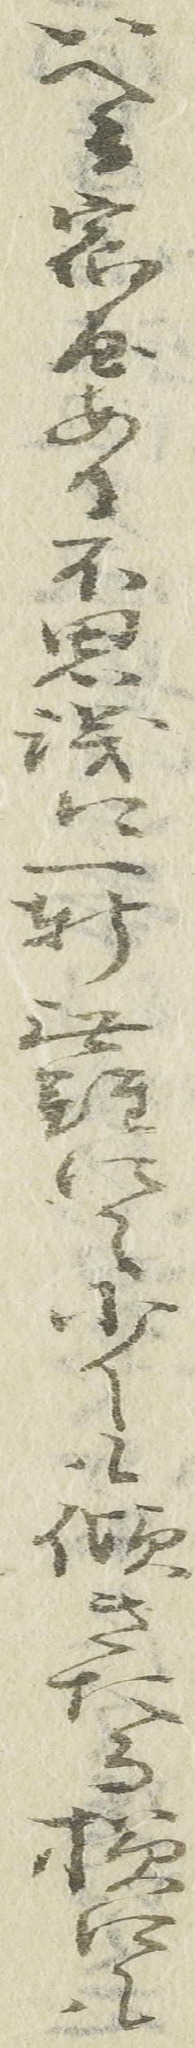いへる宿屋あり不思議に一軒無難にて少しも傾きたる様にも
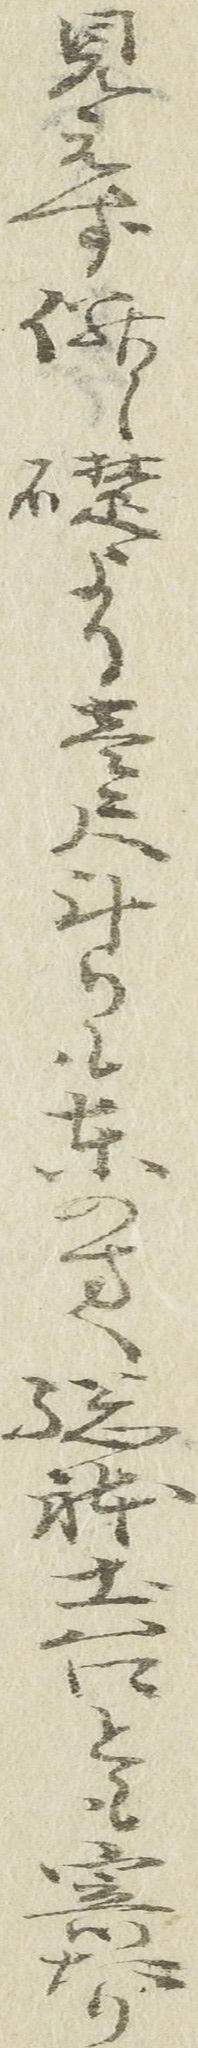見えず併し礎より壱尺計りも東の方へ総躰土台とも寄たり
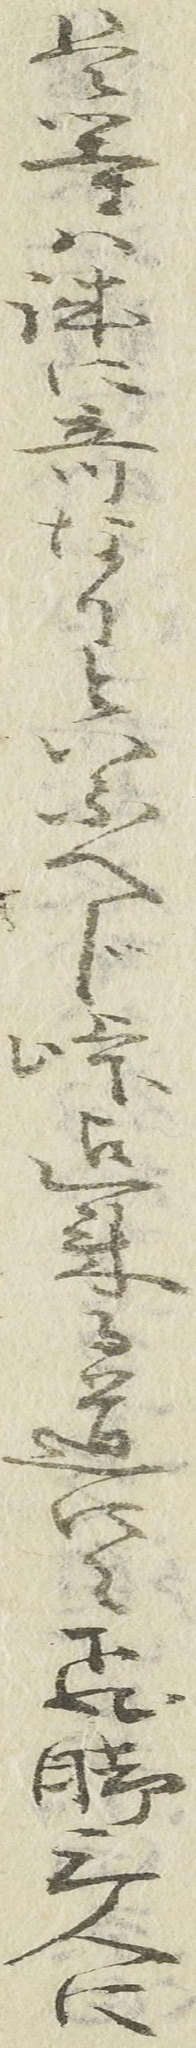是等ハ誠に奇なりといふへじ峠迄来る道にて飛脚三人に
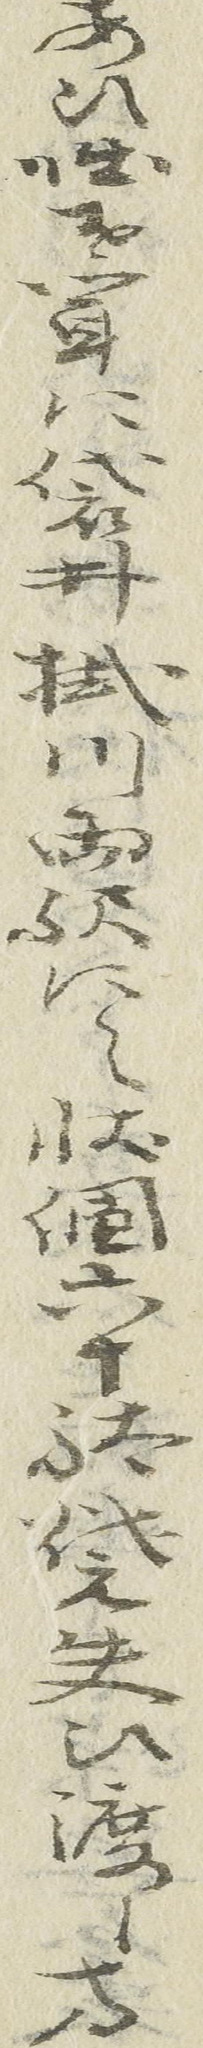あひ咄を聞に袋井掛川両駅にて状個六十駄焼失ひ渡し方
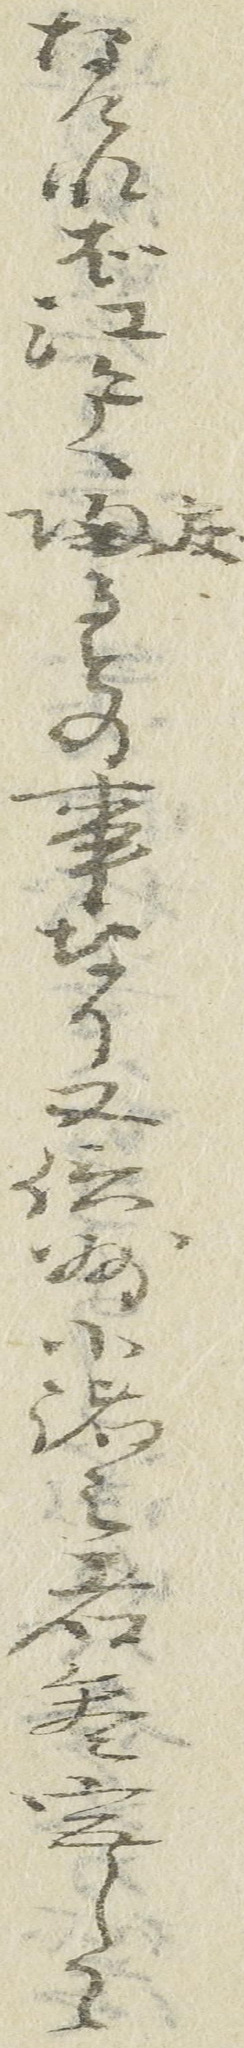なければ江戸へ戻るとの事なり又信州小諸之者参宮して
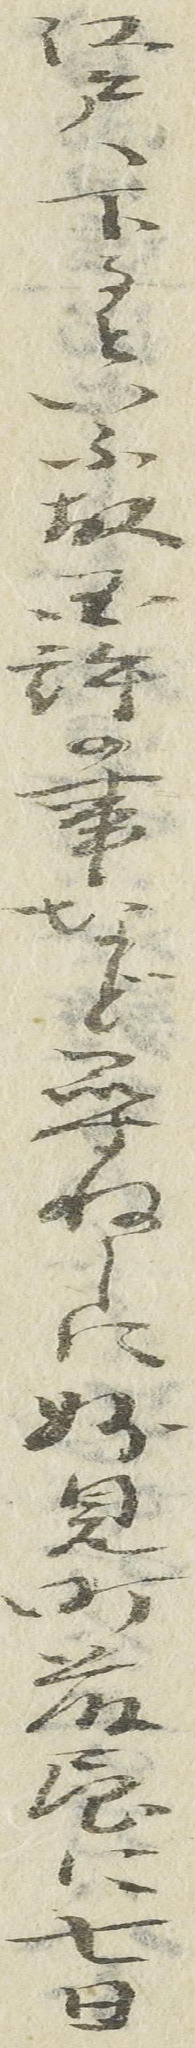江戸へ下るといふ故国許の事など尋ねしに妙見町藤屋に七日

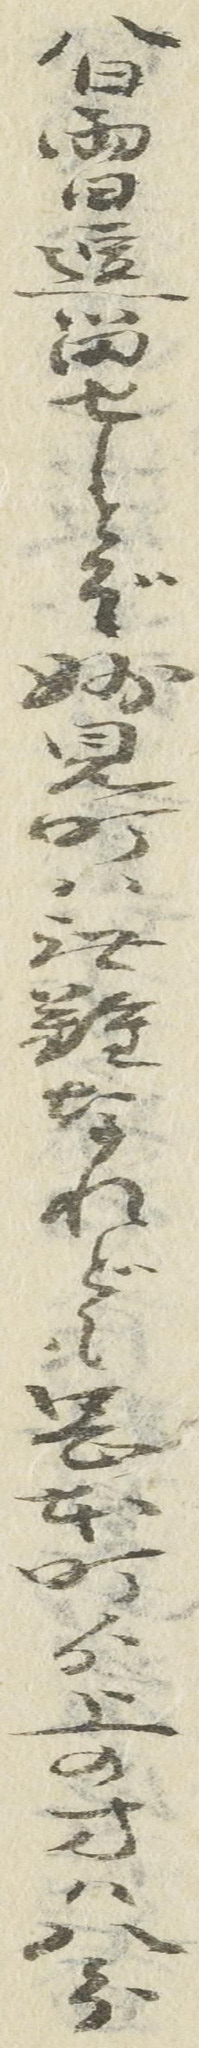八日両日逗留せしとぞ妙見町ハ無難なれども岡本町ゟ上の方ハ八分
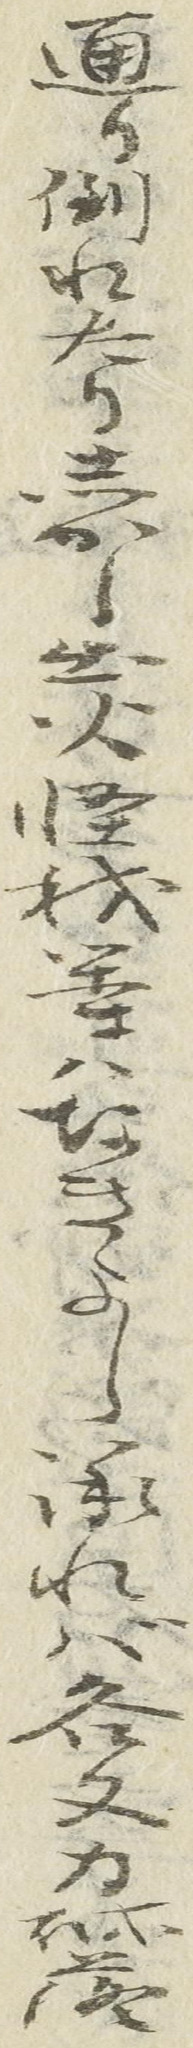通り倒れたりしかし出火怪我等ハなきよし承れバ各又力弥落
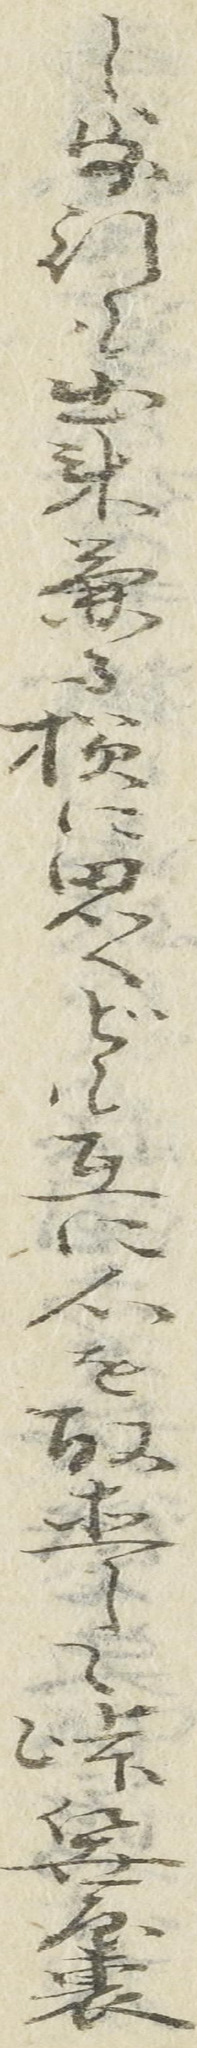し歩行も出来兼る様に思へども互に心を取直して峠笹屋裏
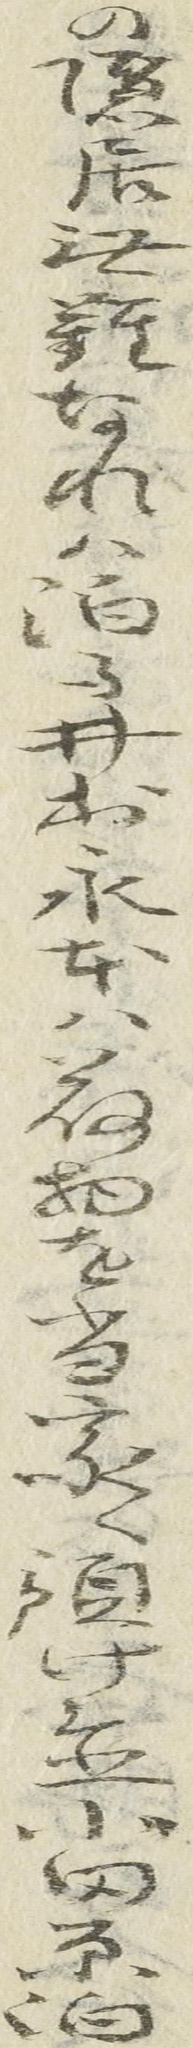の隠居無難なれハ泊る井村永本ハ荷物を当家へ預け置小田原泊
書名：地震前兆集　全
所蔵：東京大学地震研究所図書室 Earthquake Research Institute Library, The University of Tokyo, JAPAN
